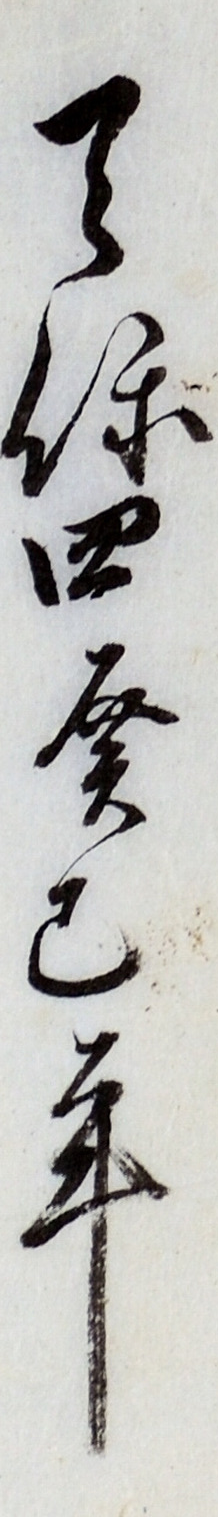天保四癸巳年
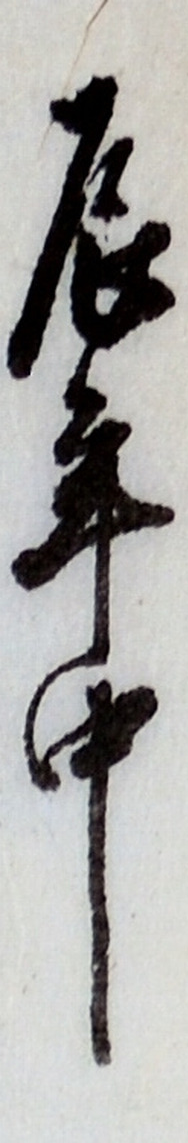辰年中
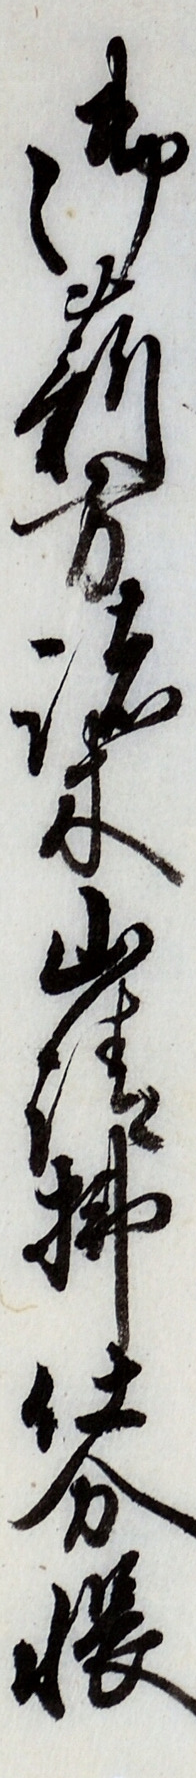御薪方諸木山請払仕分帳
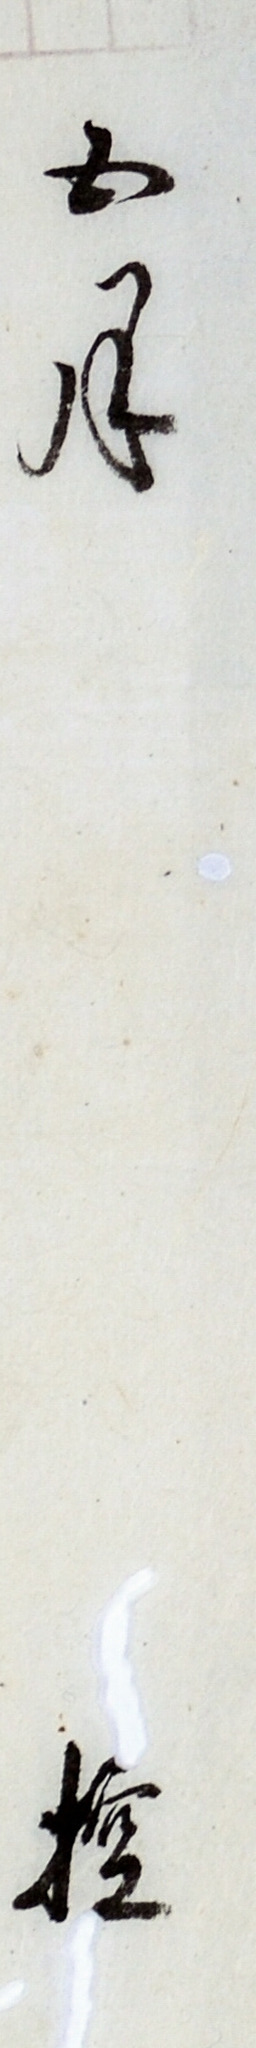五月控
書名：御薪方諸木山請払仕分帳控
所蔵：伊那市立高遠町図書館・合同会社AMANE
